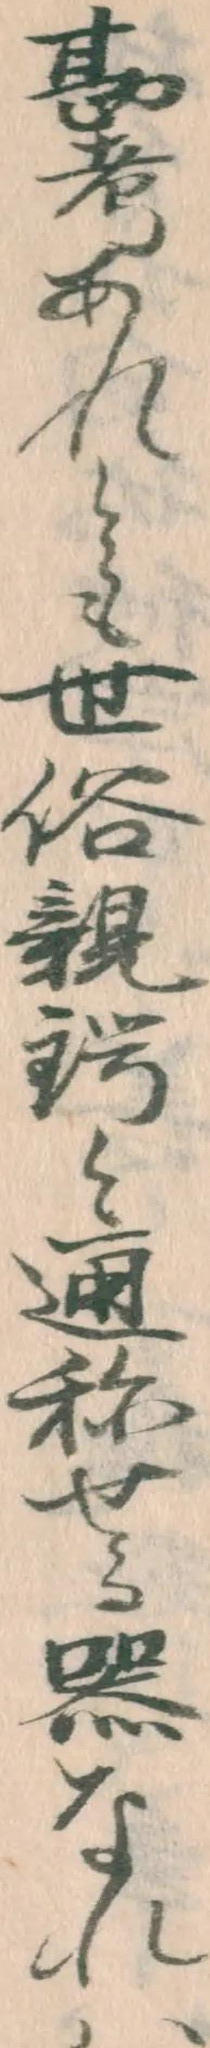勘考あれとも世俗親鍔と通称せる器なれは
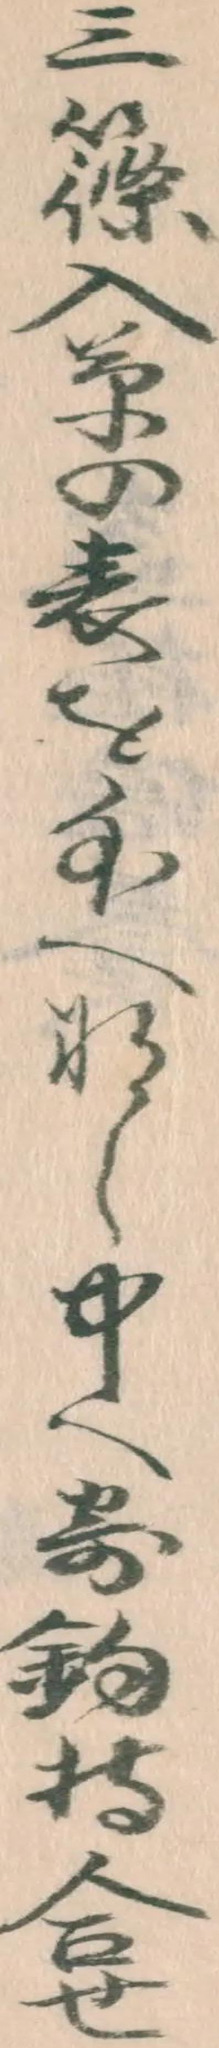三篠入草の表を外へなし中へ寄釣持合せ
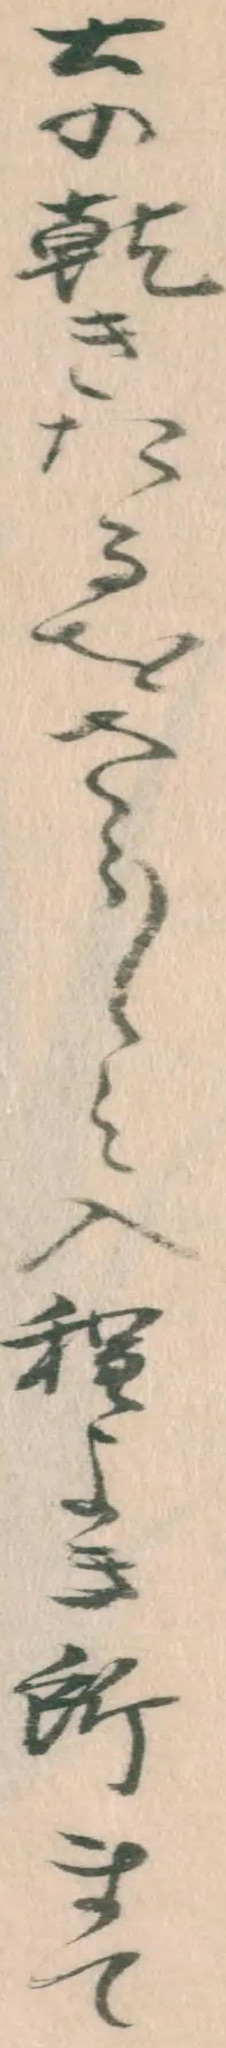土の乾きたるをさらりと入程よき所まて
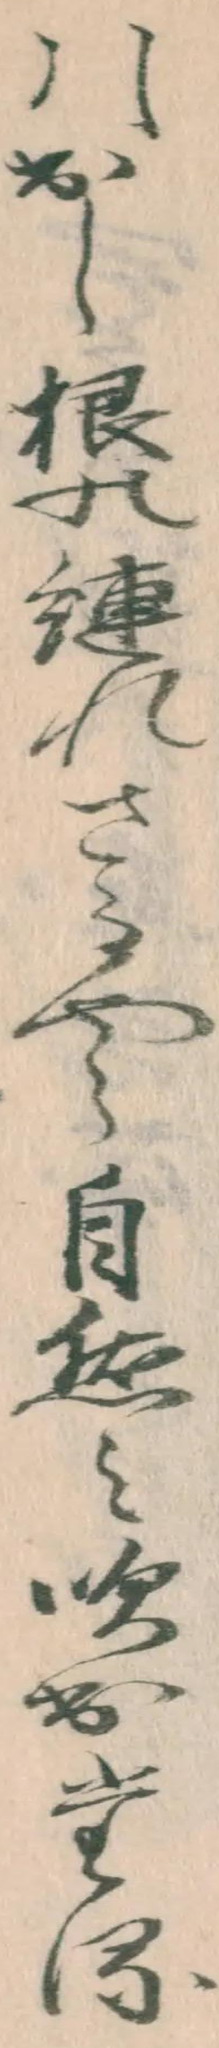引出し根の縺れさるやら自然と吹出たる
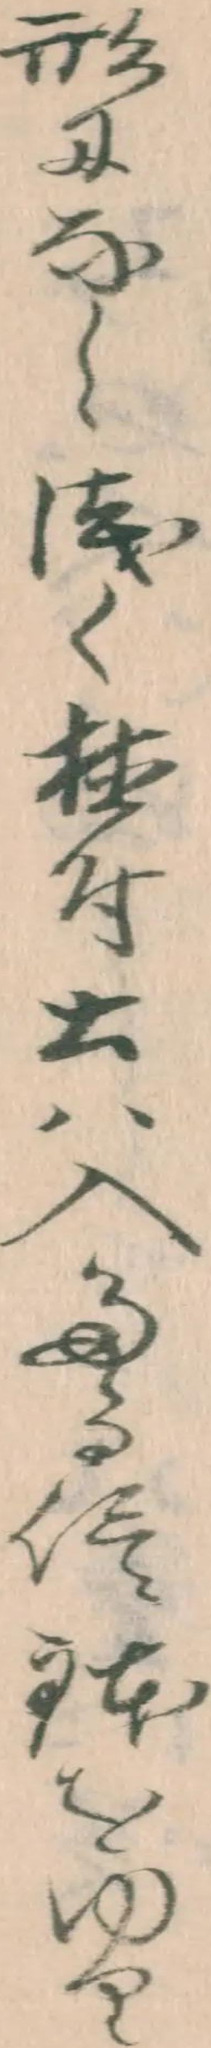形になし浅く植付土は入たる侭鉢をゆり
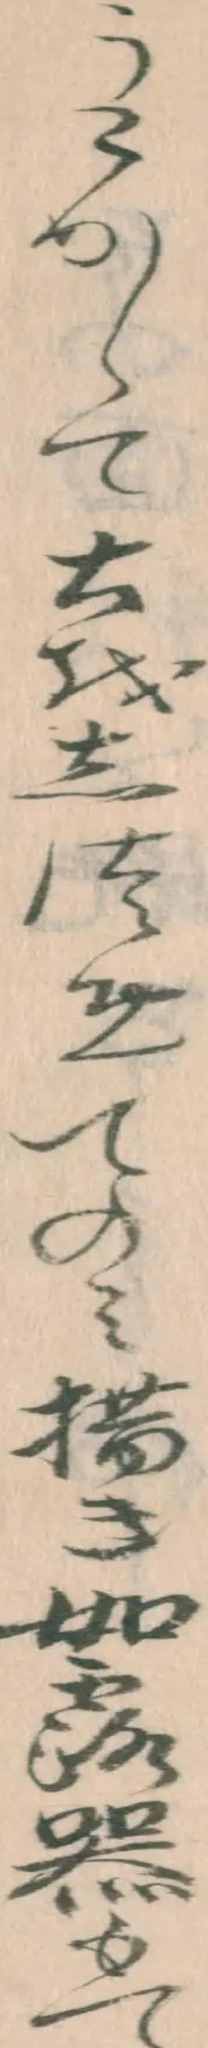うこかして土をつめてのみ措き如露器もて
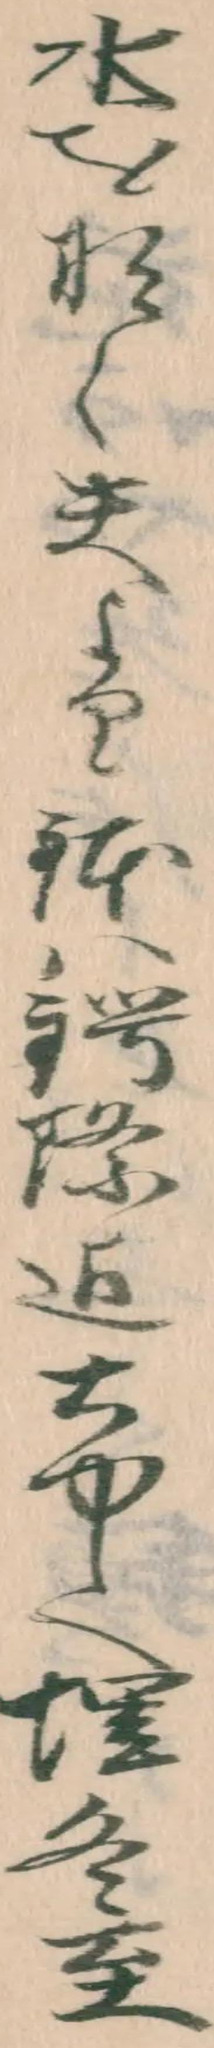水をななし夫より鉢は鍔際迠土中へ埋冬至
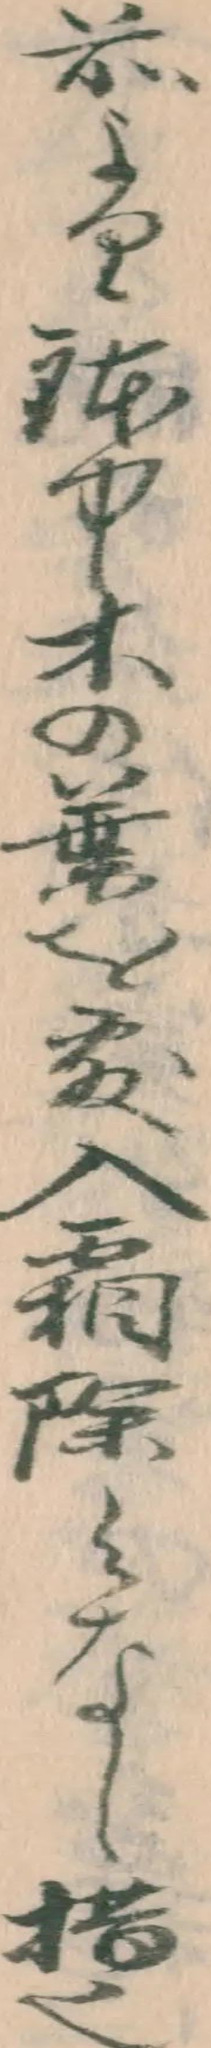前より鉢中木の葉を寄入霜除となし措也
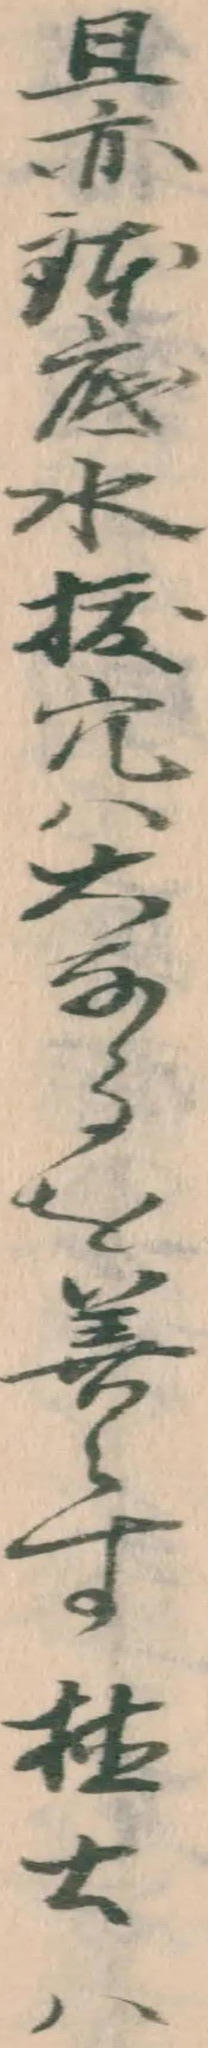且亦鉢底水抜穴は大なるを善とす植土は
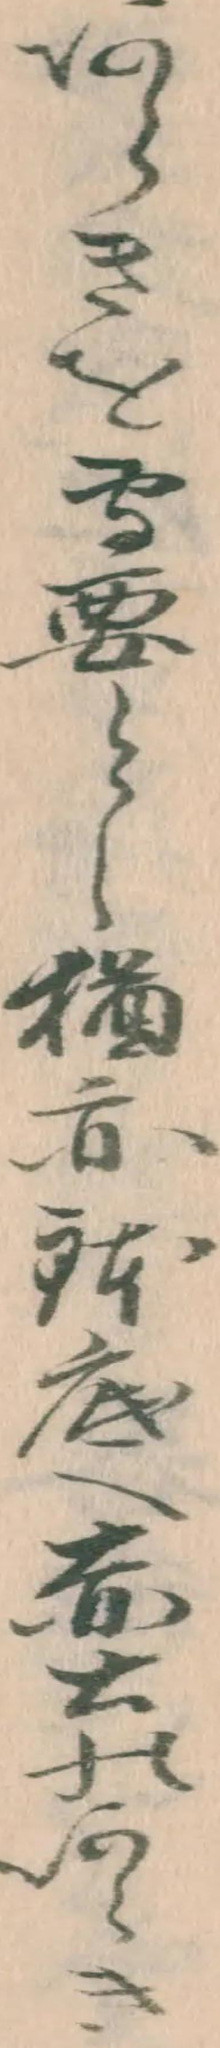あらきを専とし猶亦鉢底へ赤土のあらき
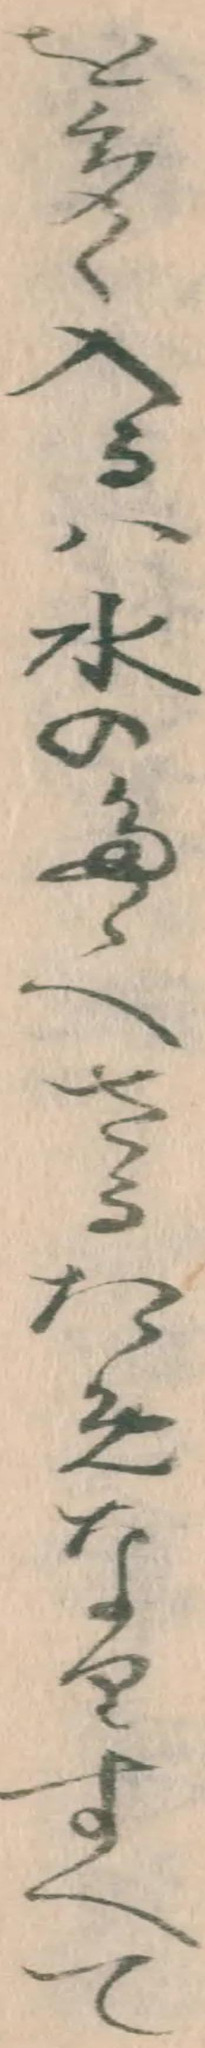を多く入るは水のたゝへさるためなりすへて
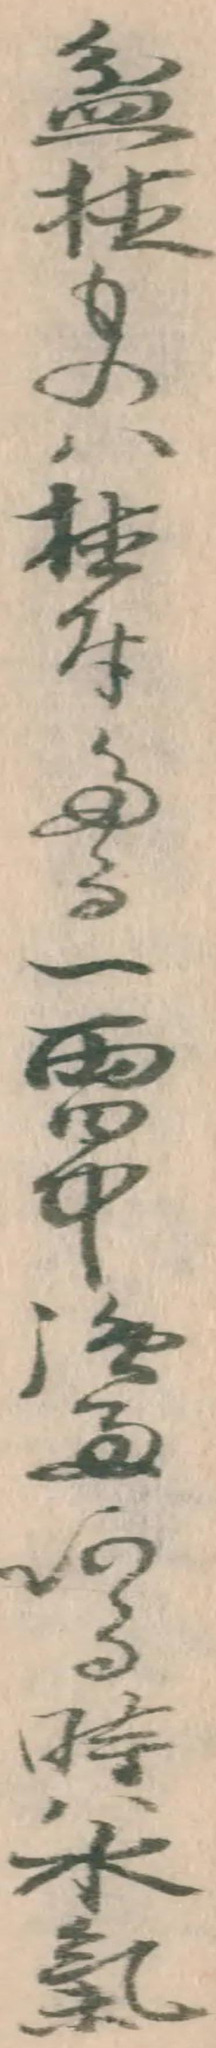盆植ものは植付たる一両日中強雨ある時は水気
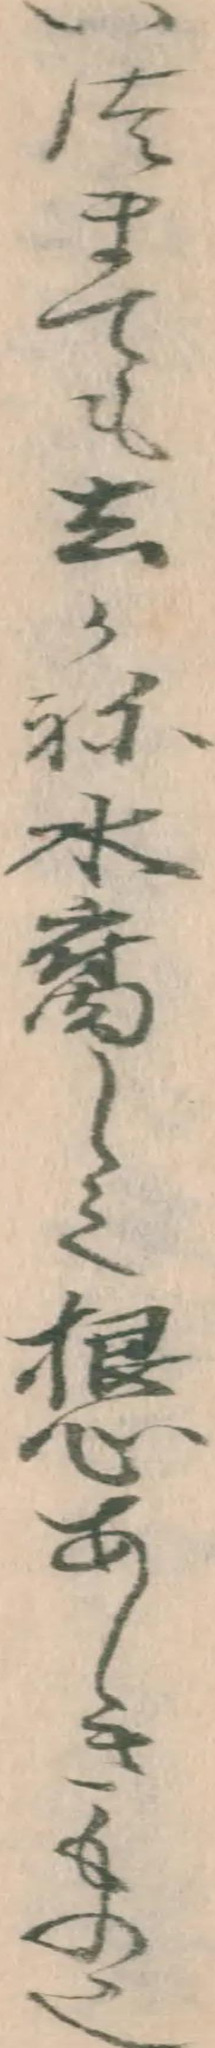いつまても去かね水腐して根心あしきもの也
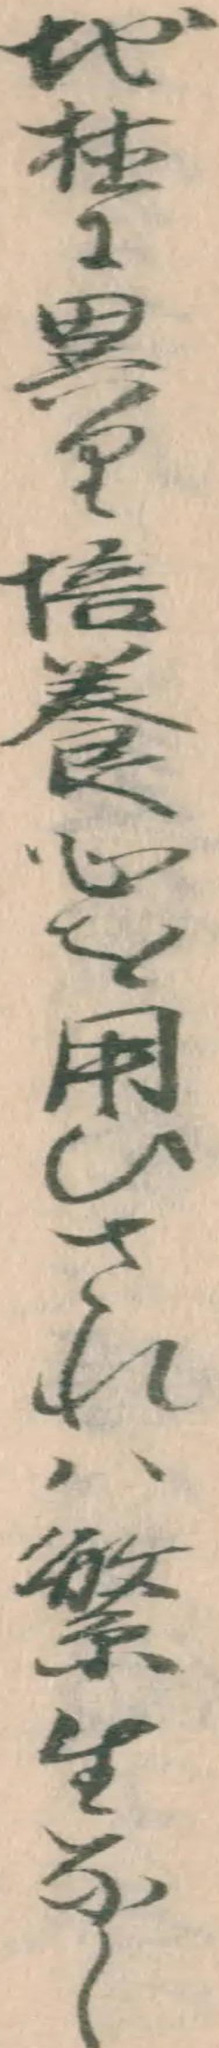地植に異り培養心を用ひされは繁生なし
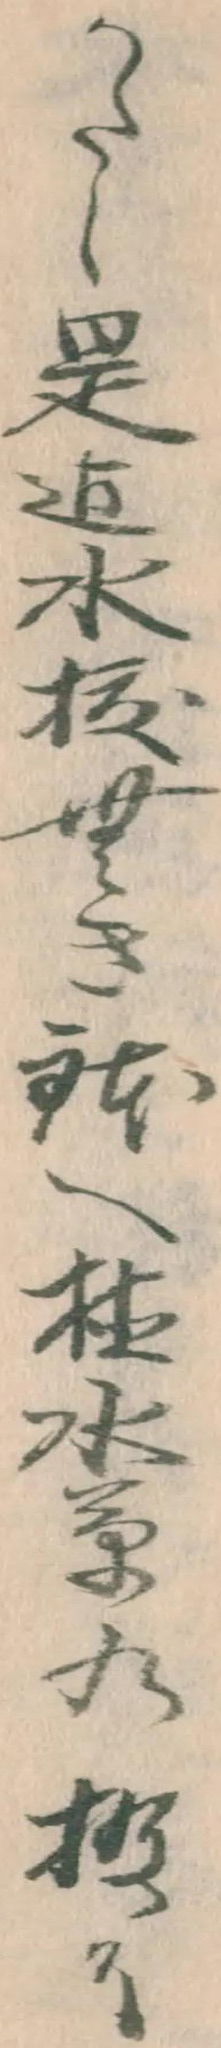かたし是迠水抜無き鉢へ植水草の扱
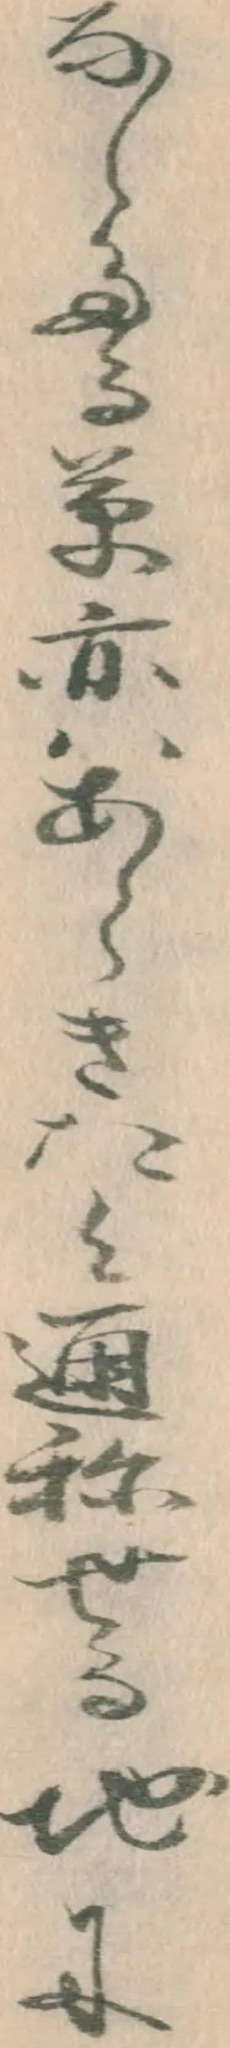なしたる草亦はあらきたと通称せる地に
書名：花菖培養録
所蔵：国立国会図書館 National Diet Library, JAPAN
